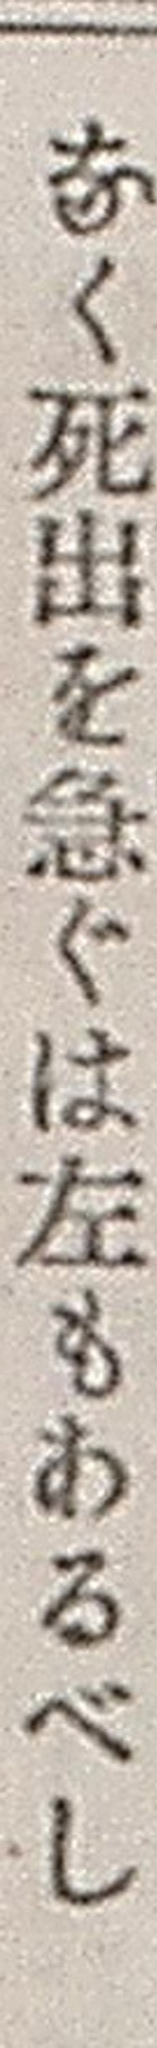なく死出を急ぐは左もあるべし
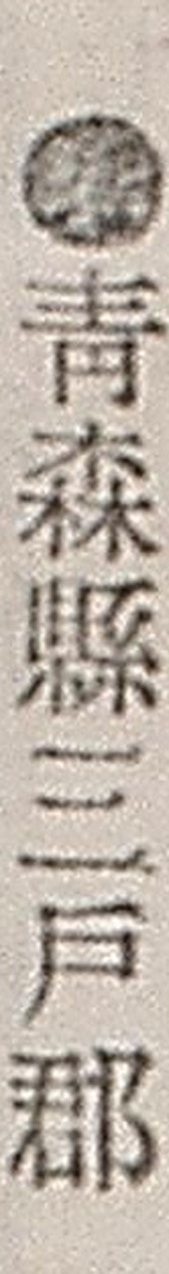●青森県三戸郡
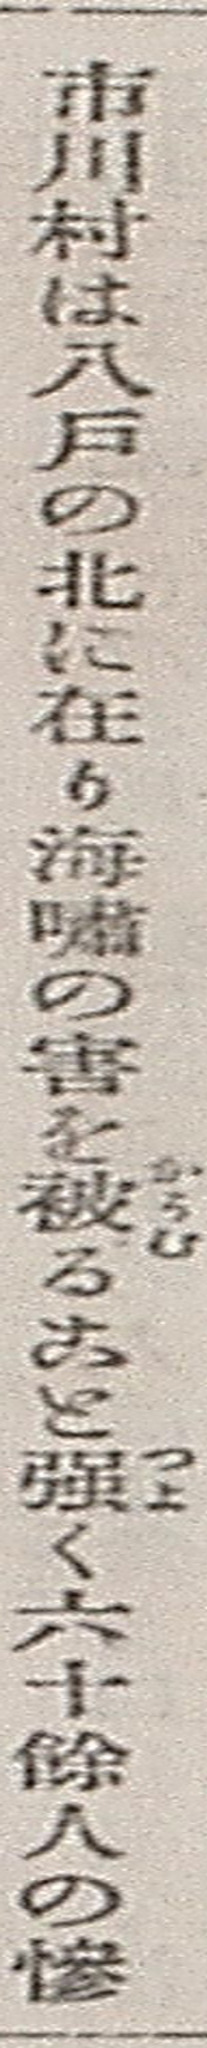市川村は八戸の北に在り海嘯の害を被ること強く六十余人の惨
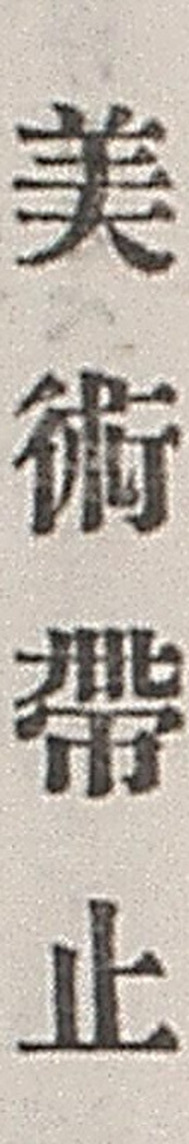美術帯止
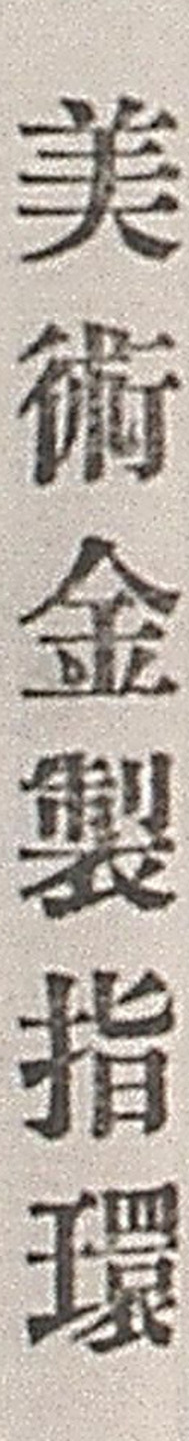美術金製指輪
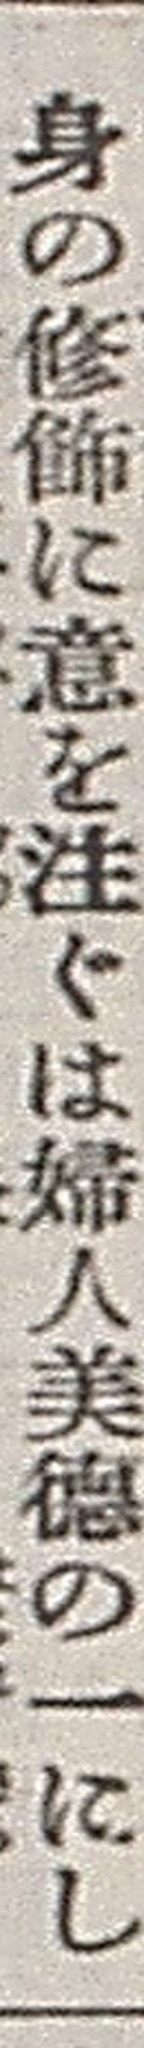身の修飾に意を注ぐは婦人美徳の一にし
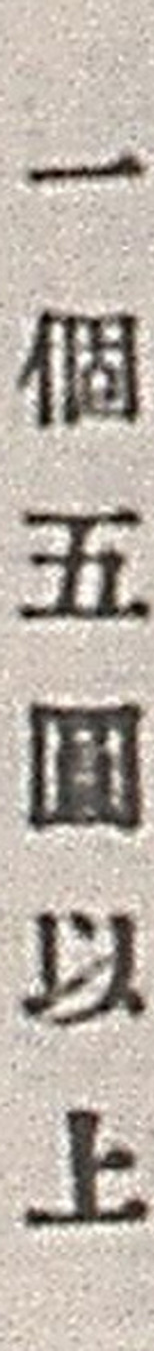一個五円以上
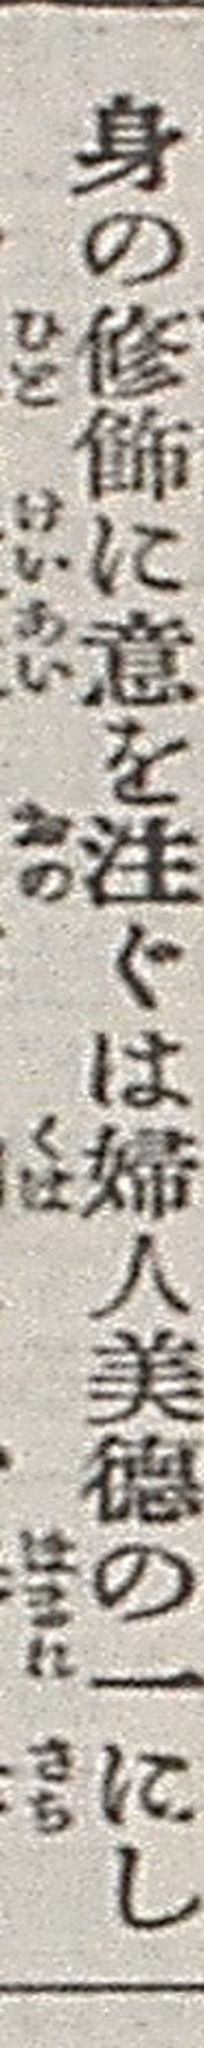身の修飾に意を注ぐは婦人美徳の一にし
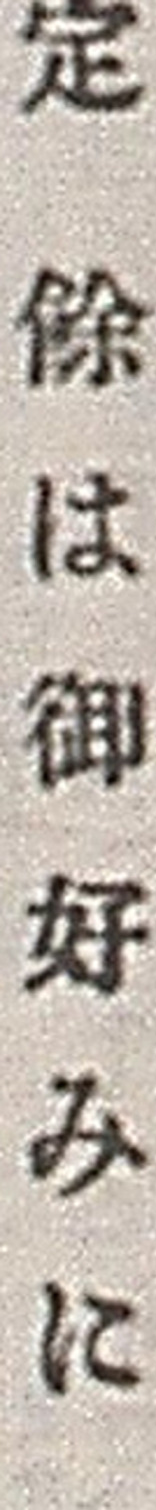定余は御好みに
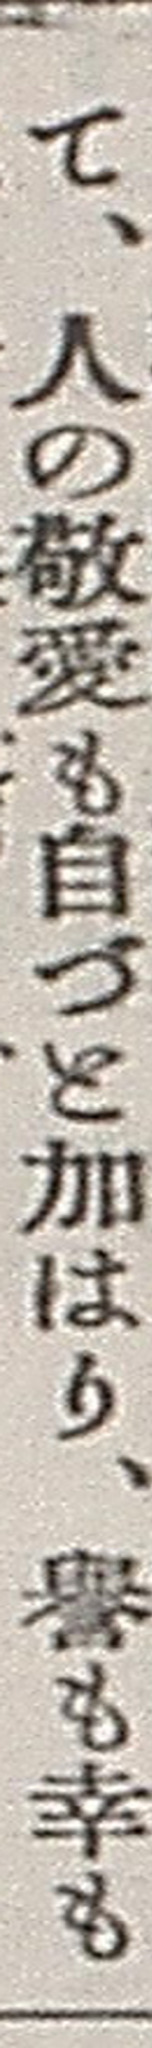て、人の敬愛も自づと加はり、誉も幸も
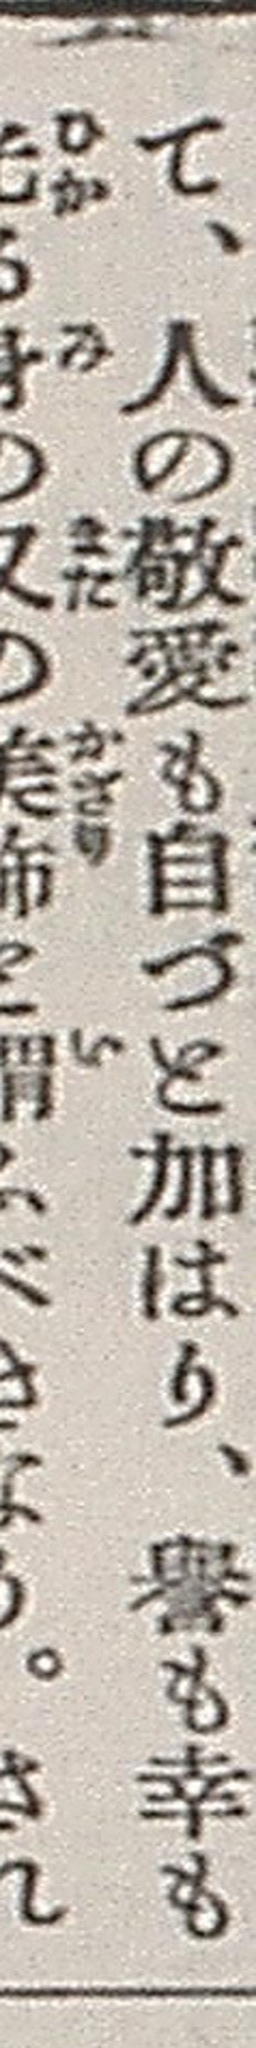光る身の又の美飾と謂ふべきなり。され
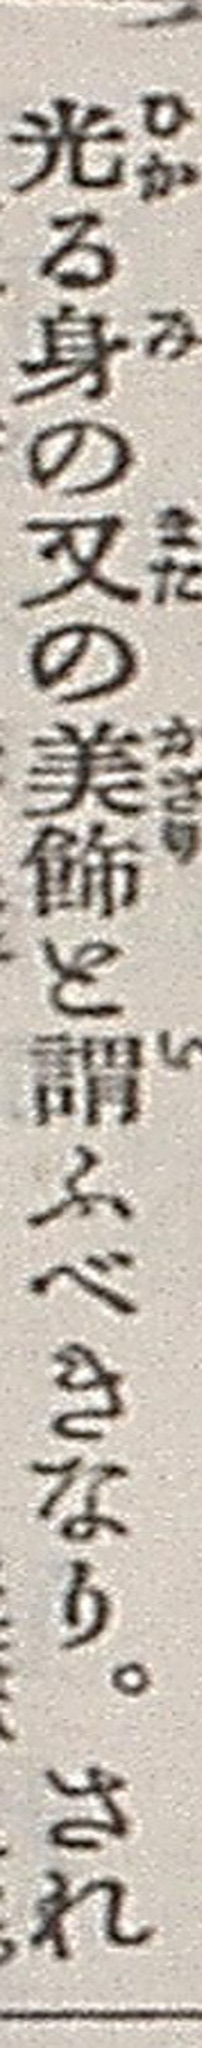光る身の又の美飾と謂ふべきなり。され
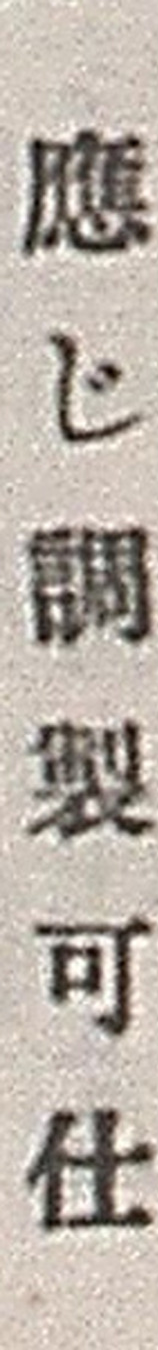価応じ調製可仕
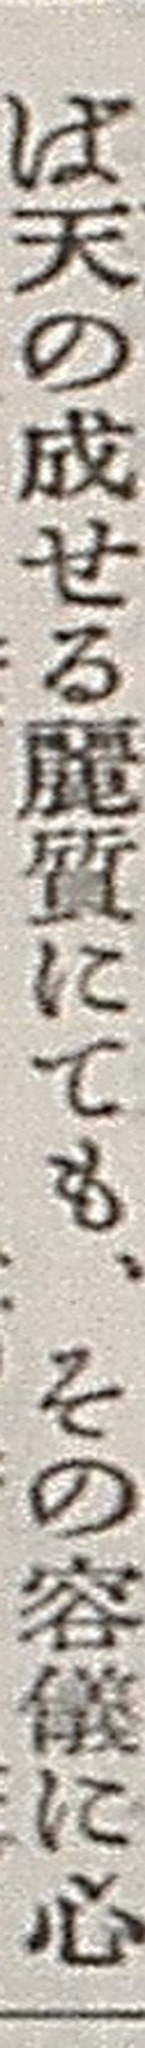ば天の成せる麗質にても、その容儀に心
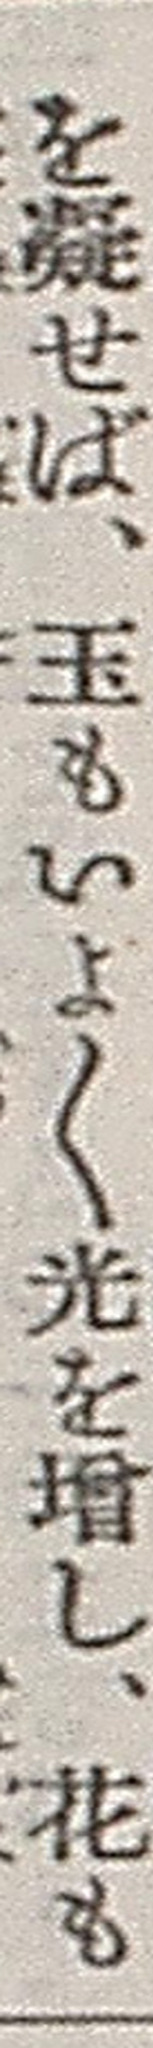を凝せば、玉もいよ〳〵光を増し、花も
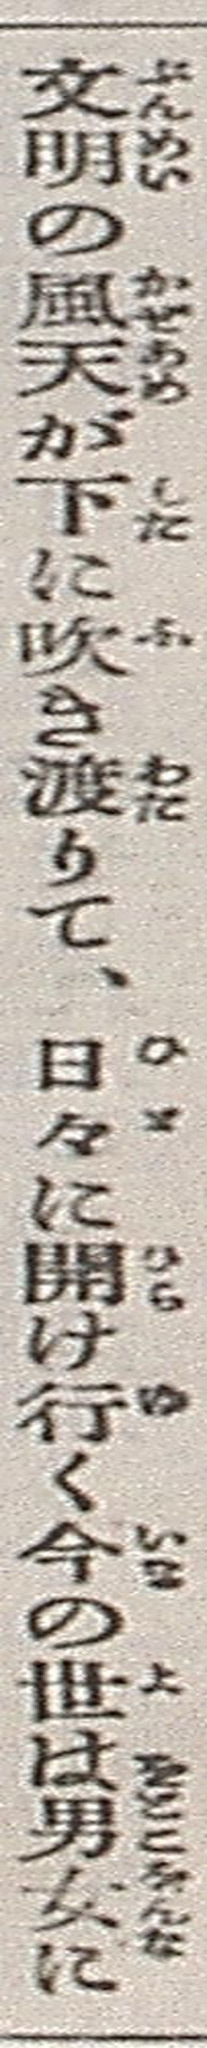文明の風天が下に吹き渡りて、日々に開け行く今の世は男女に
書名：風俗畫報臨時増刊第百十九號　大海嘯被害録（中）
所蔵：東京大学地震研究所図書室 Earthquake Research Institute Library, The University of Tokyo, JAPAN
